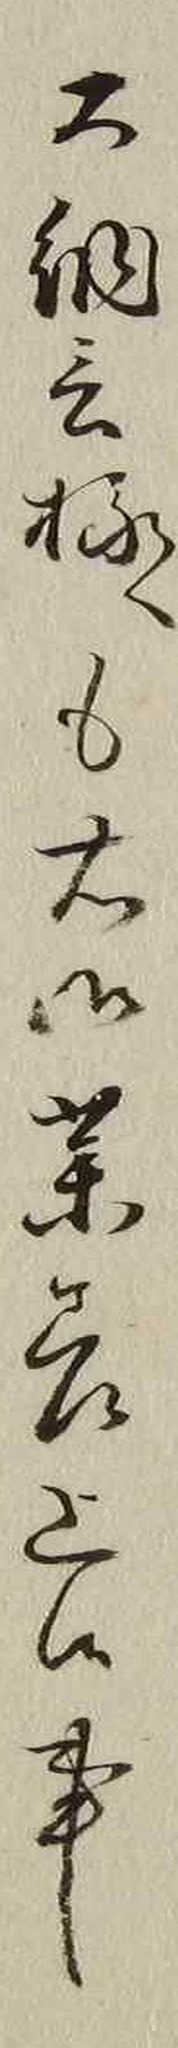大納言様へも右御薬差上候事
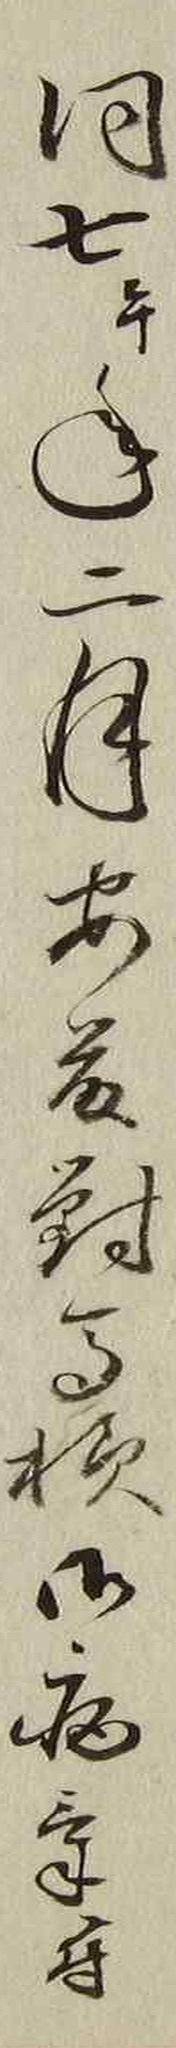一同七午年二月安藤対馬守様御病気ニ付
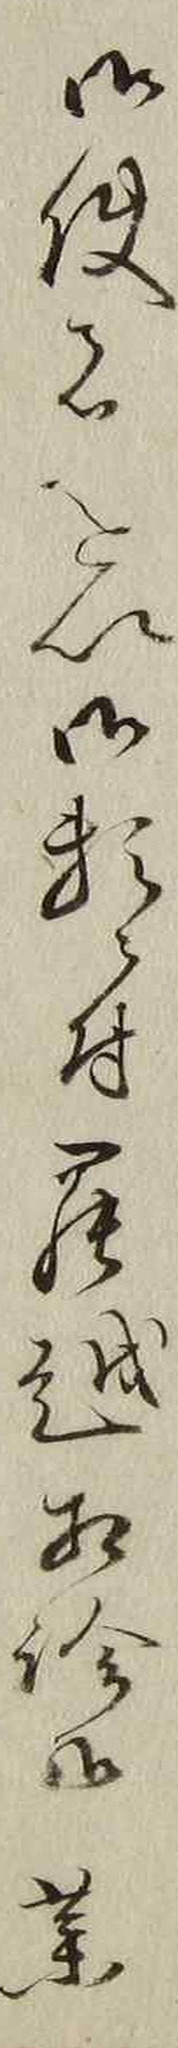御使者を以御頼ニ付罷越相診御薬
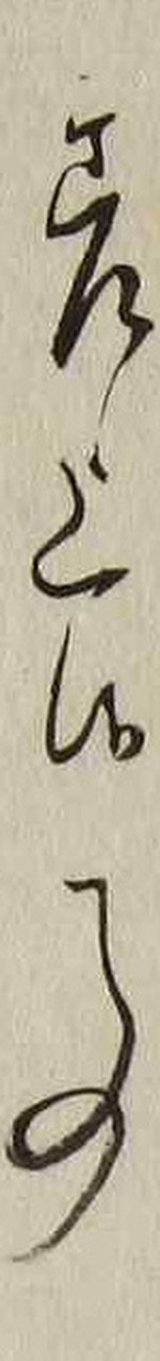差上候事
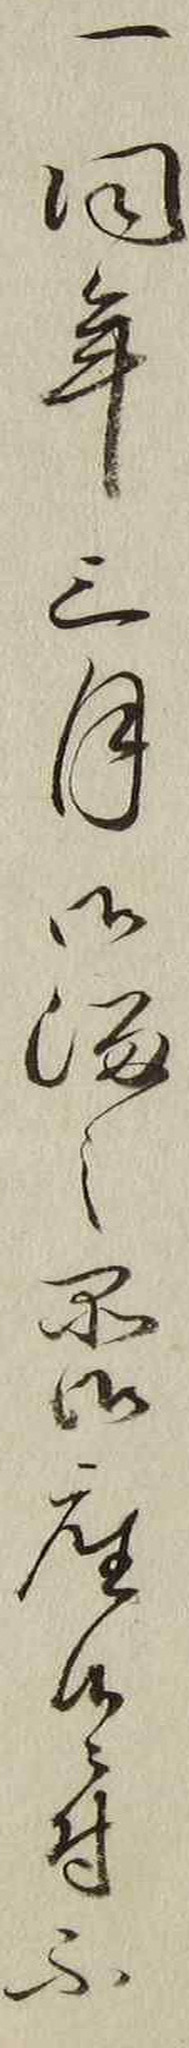一同年三月御溜之品御座候ニ付不
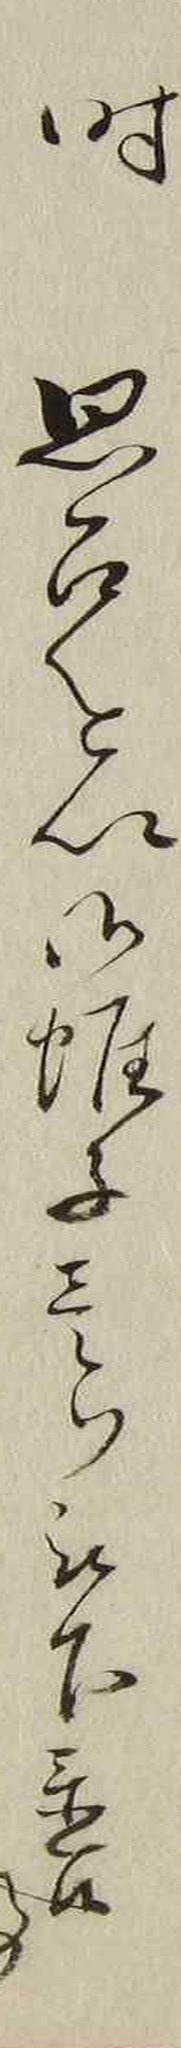時思召を以御帷子壱ツ被下置候事
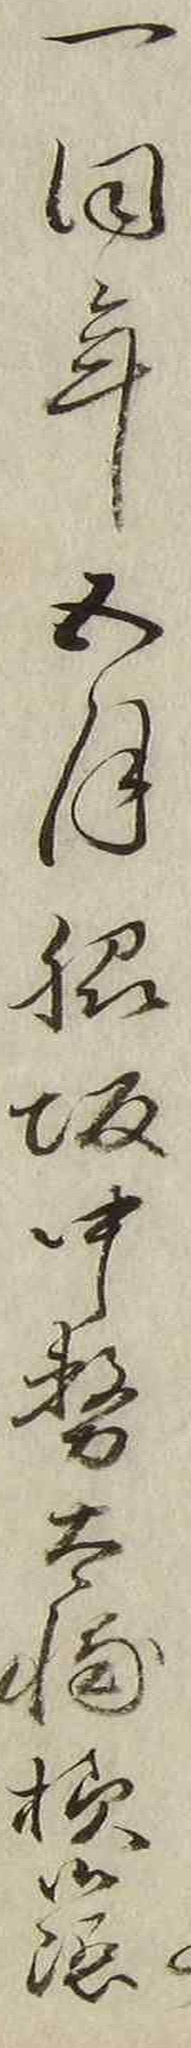一同年五月脇坂中務大輔様御隠
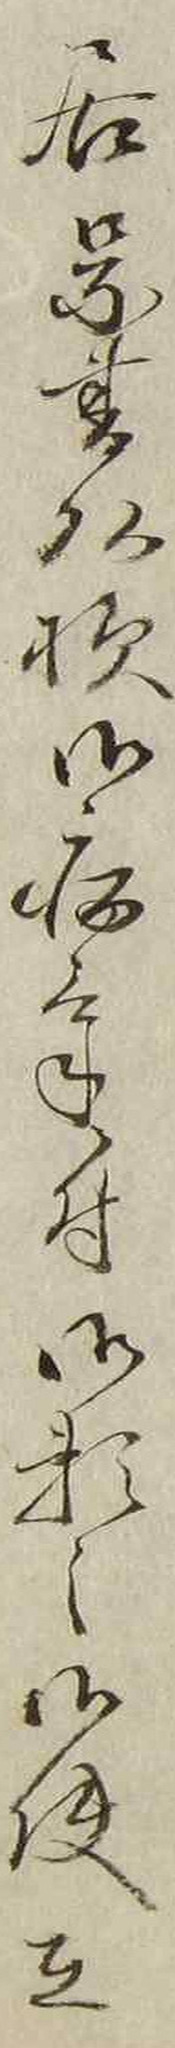居図書頭様御病気ニ付御頼之御使在

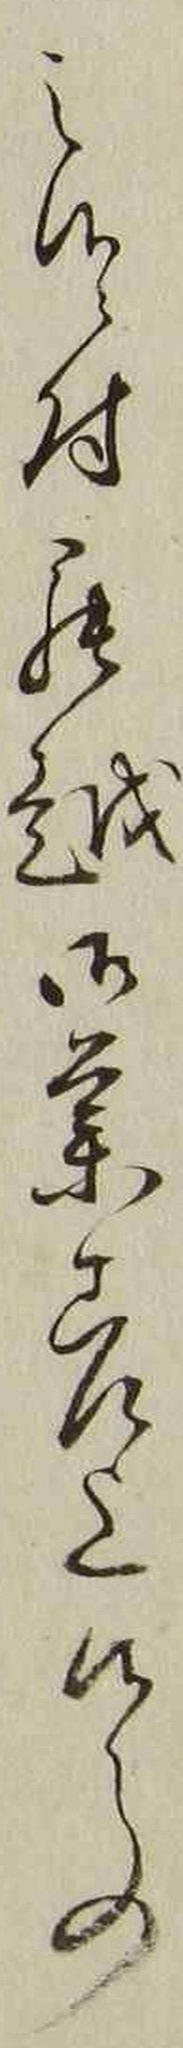之候ニ付罷越御薬差上候事
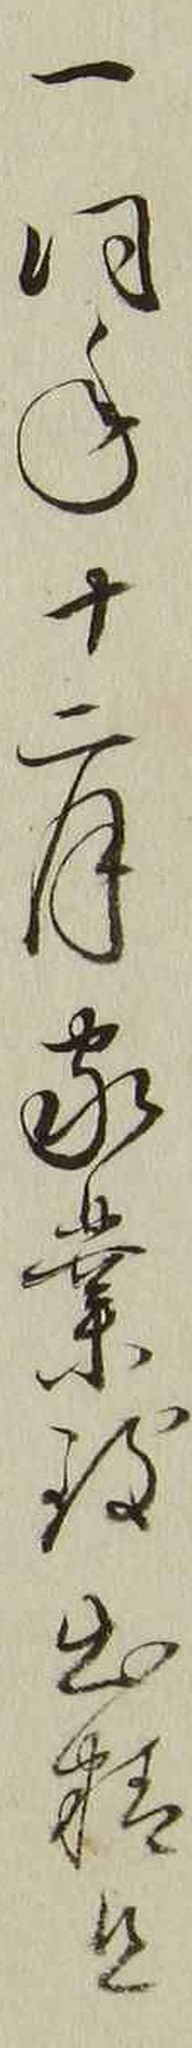一同年十二月家業致出精且
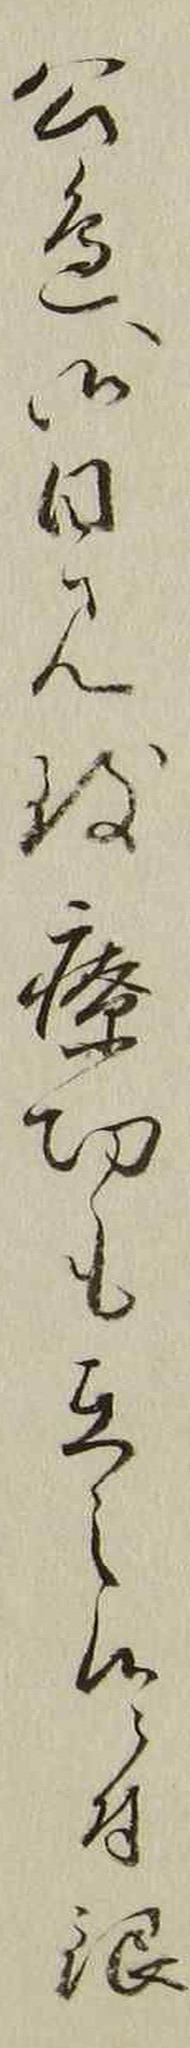公辺へ御目見致療切も在之候ニ付銀
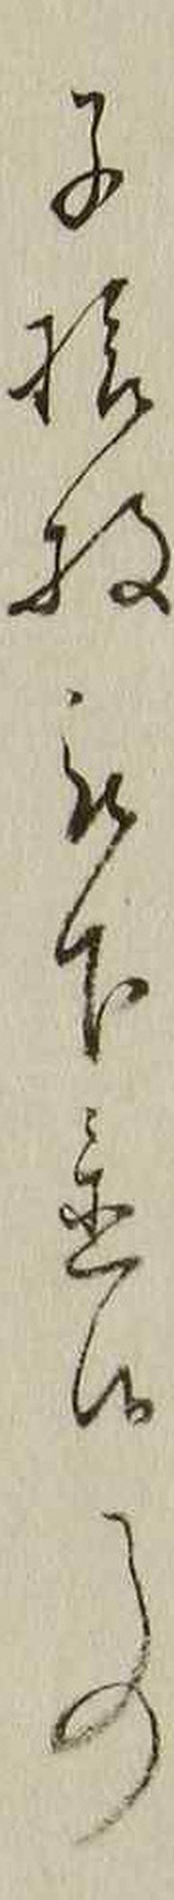子拾枚被下置候事
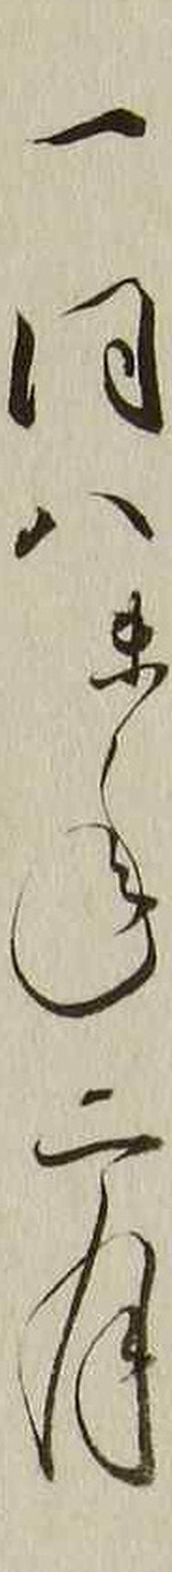一同八未年二月
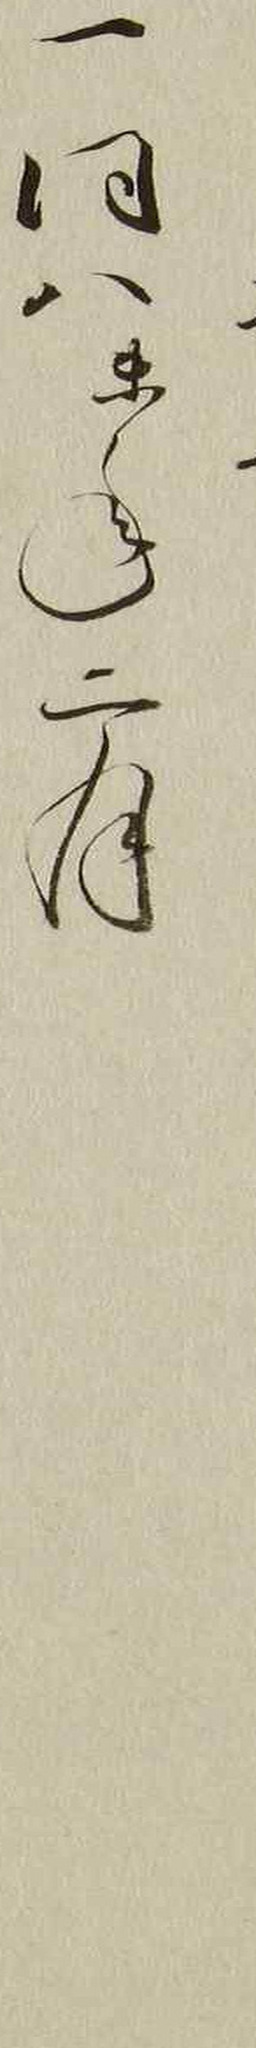一同八未年二月
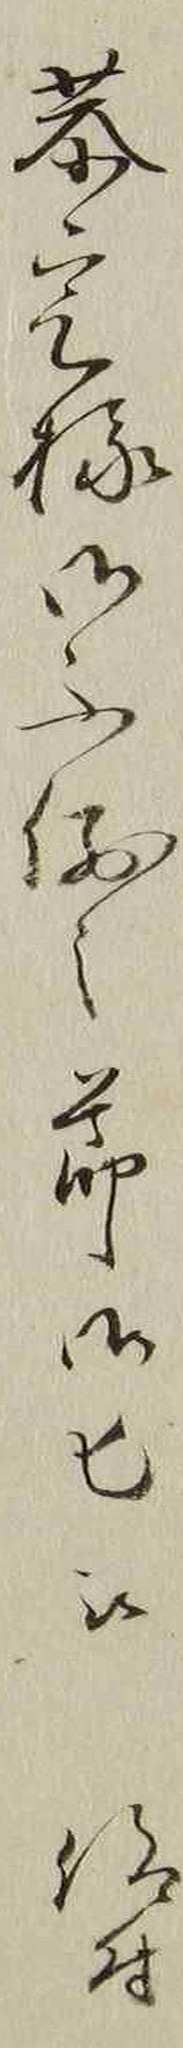恭定様御不例之節御匕被仰付
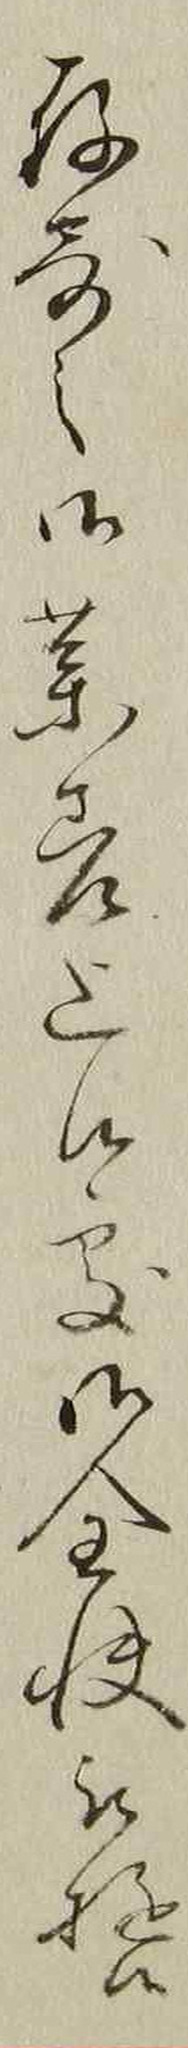存寄之御薬差上候処御全快被遊候
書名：諸士系譜　巻之8　い之部8
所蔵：会津若松市立会津図書館
